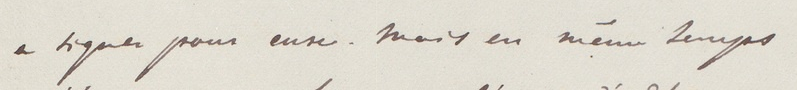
a signer pour eux. Mais en même temps
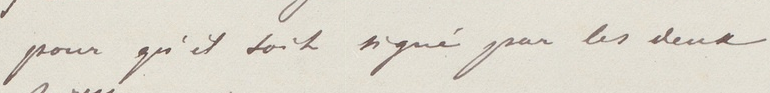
pour qu'il soit signé par les deux
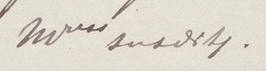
Mrss susdits.
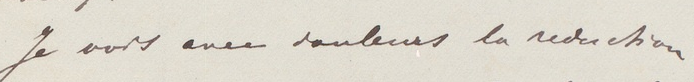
Je vois avec douleurs la reduction
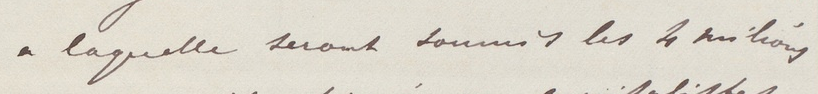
a laquelle seront soumis les 4 milions
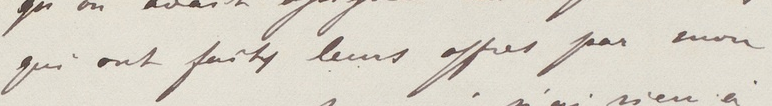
qui ont faits leurs offres par mon
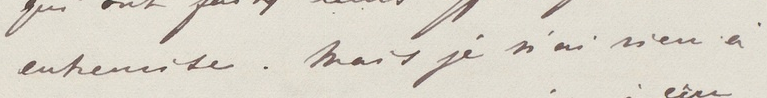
entremise. Mais je n'ai rien à
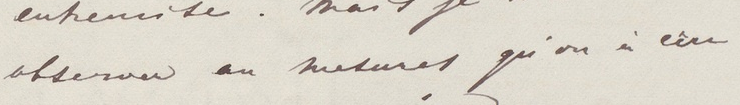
observer au natures qu'on à eûe
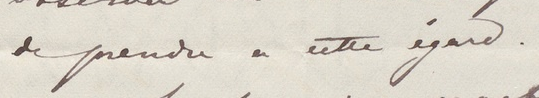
de prendre a cette égard.
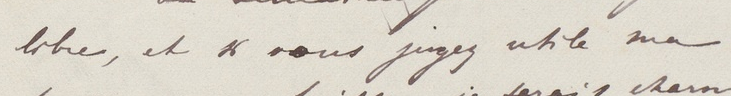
libre, et si vous jugez utile ma
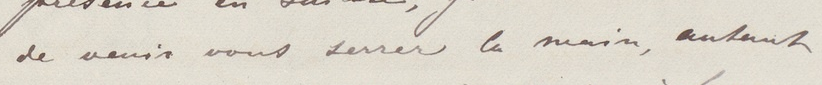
de venir vous serrer la main, autant
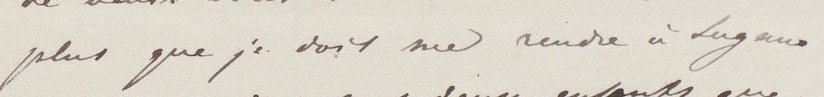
plus que je dois me rendre à Lugano
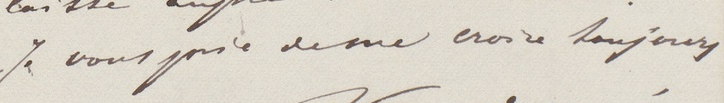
Je vous prie de me croire toujours
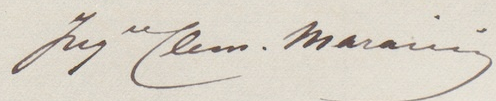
Ingre Clem. Maraini
